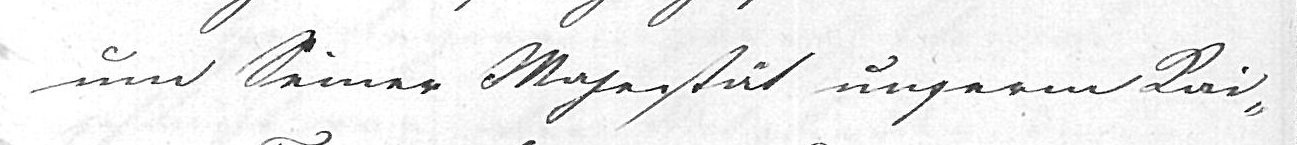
um Seiner Majestät unseren Kai-
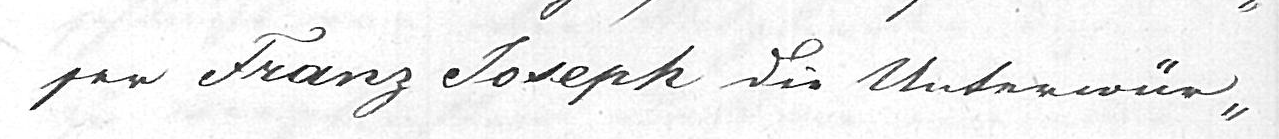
ser Franz Joseph die Unterwür-
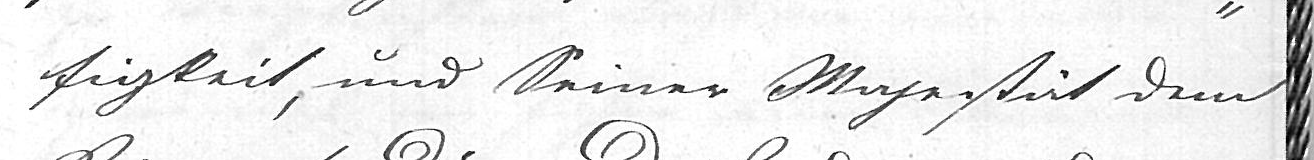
figkeit, und Seiner Majestät dem
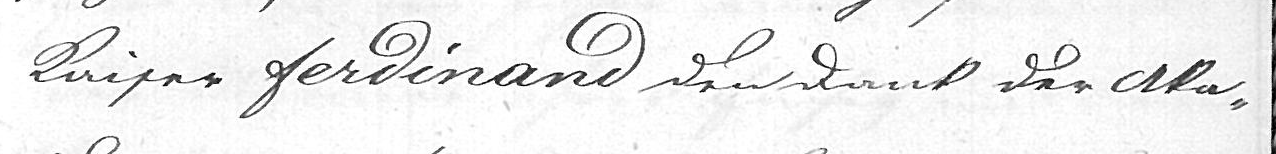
Kaiser Ferdinand den Dank der Aka-
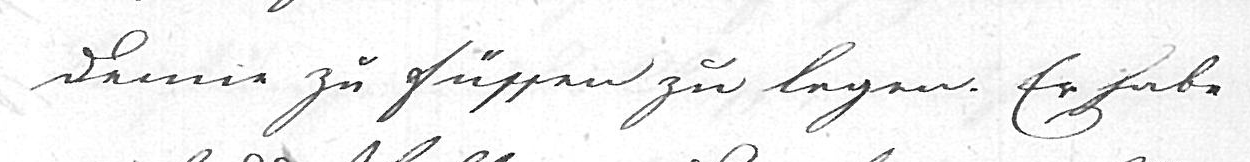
demie zu Füssen zu legen. Er habe
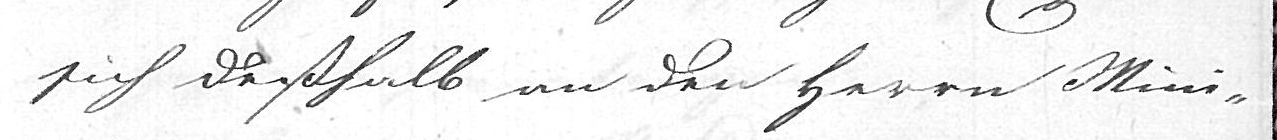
sich deßhalb an den Herrn Mini-
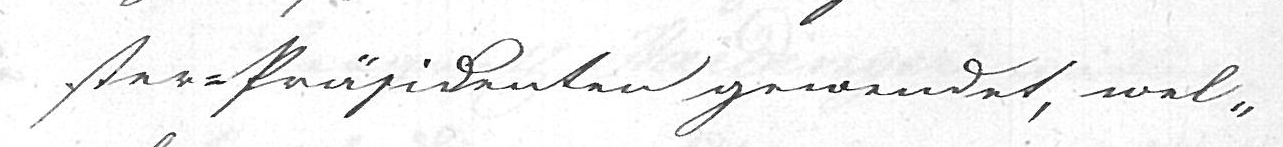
ster-Präsidenten gewendet, wel-
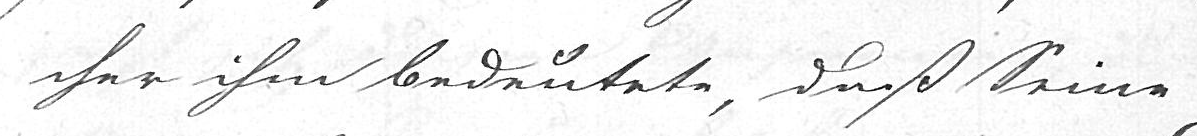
cher ihm bedeutete, daß Seine
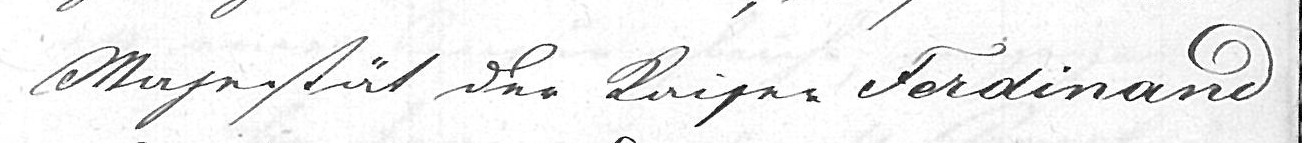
Majestät der Kaiser Ferdinand
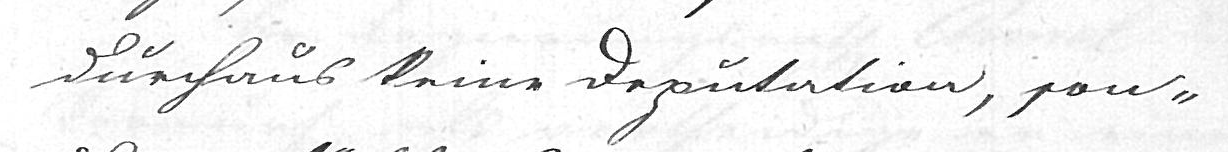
durchaus keine Deputation, son-
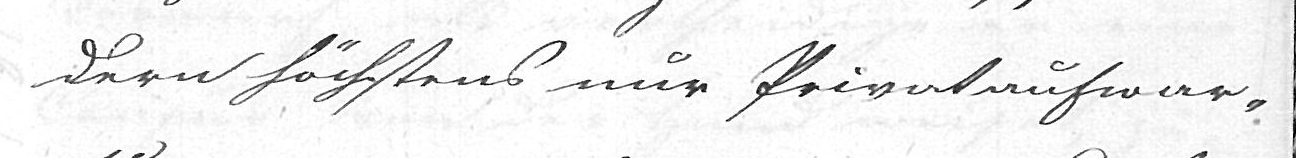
dern höchstens nur Privataufwar-
